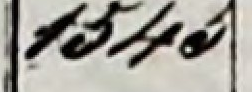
1545
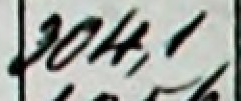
304,1
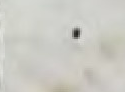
„
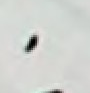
„
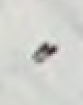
„
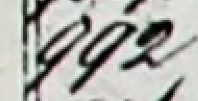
992
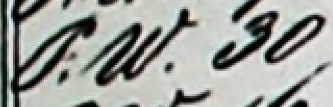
P.W. 30
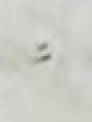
„
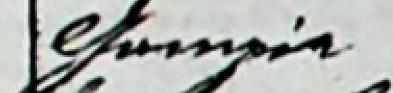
Gamzie
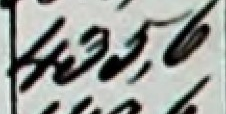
435,6
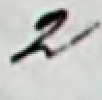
2
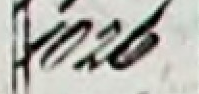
1026
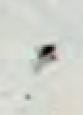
„
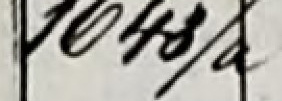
1648/a
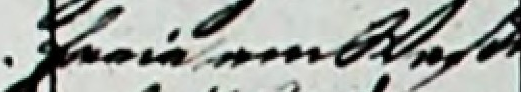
Freie am Westen„
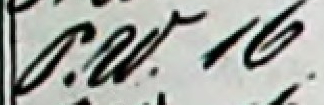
P.W. 16
